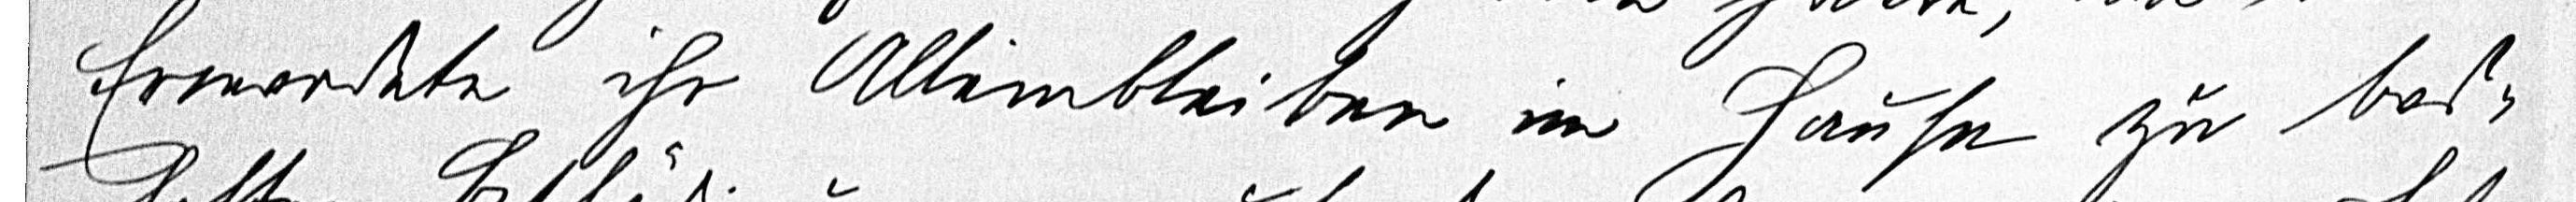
Ermordete ihr Alleinbleiben im Hause zu bos¬
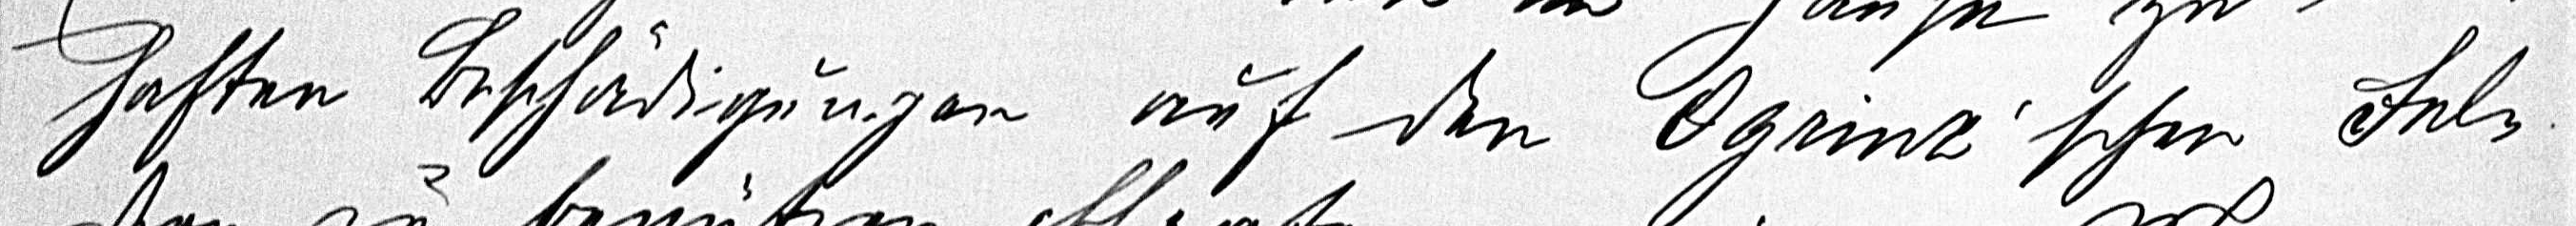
haften Beschädigungen auf den Ogrinz’schen Fel¬
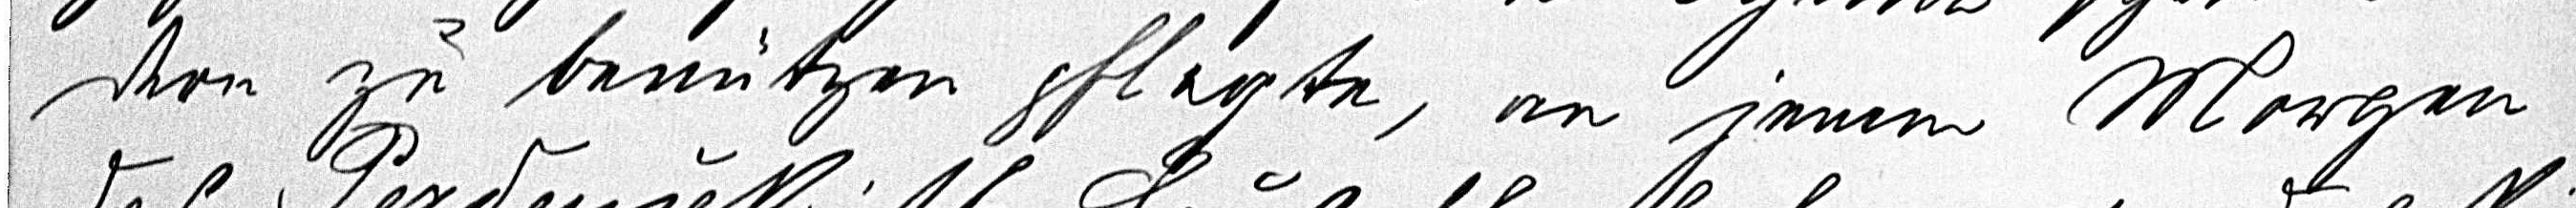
den zu benützen pflegte, an jenem Morgen
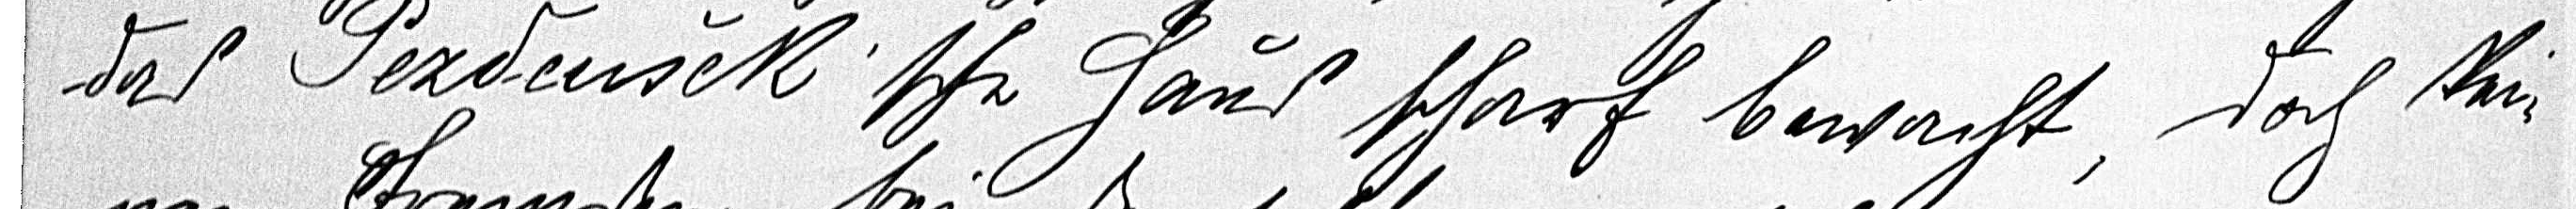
das Pezdeušek’sche Haus scharf bewacht, doch kei¬
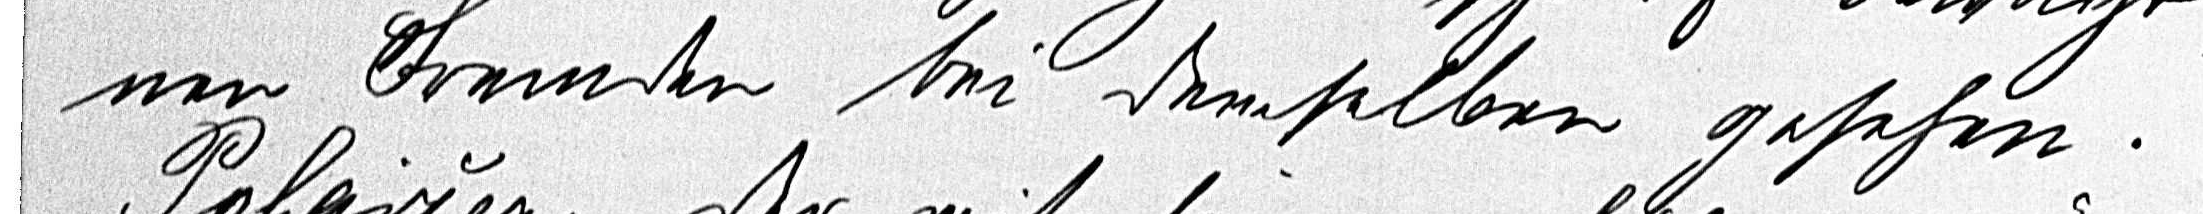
nen Fremden bei demselben gesehen.
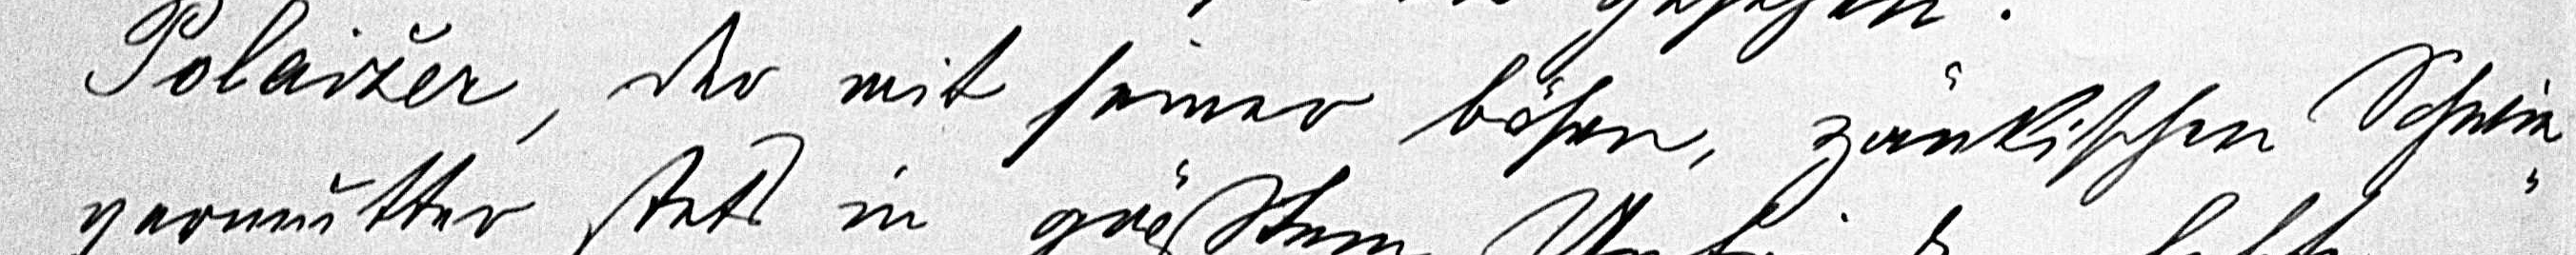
Polaižer, der mit seiner bösen, zänkischen Schwie¬
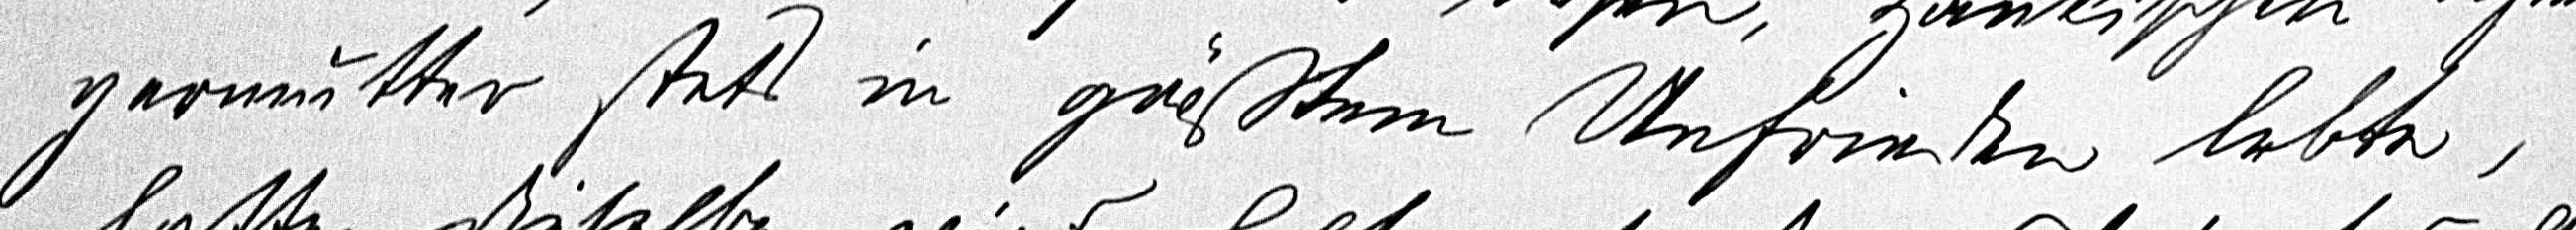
germutter stets in größtem Unfrieden lebte,
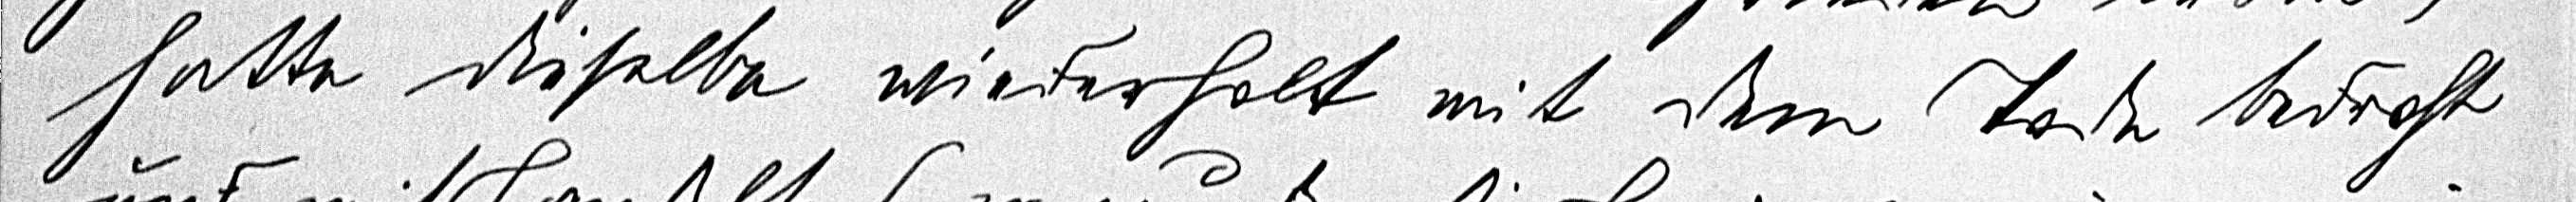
hatte dieselbe wiederholt mit dem Tode bedroht
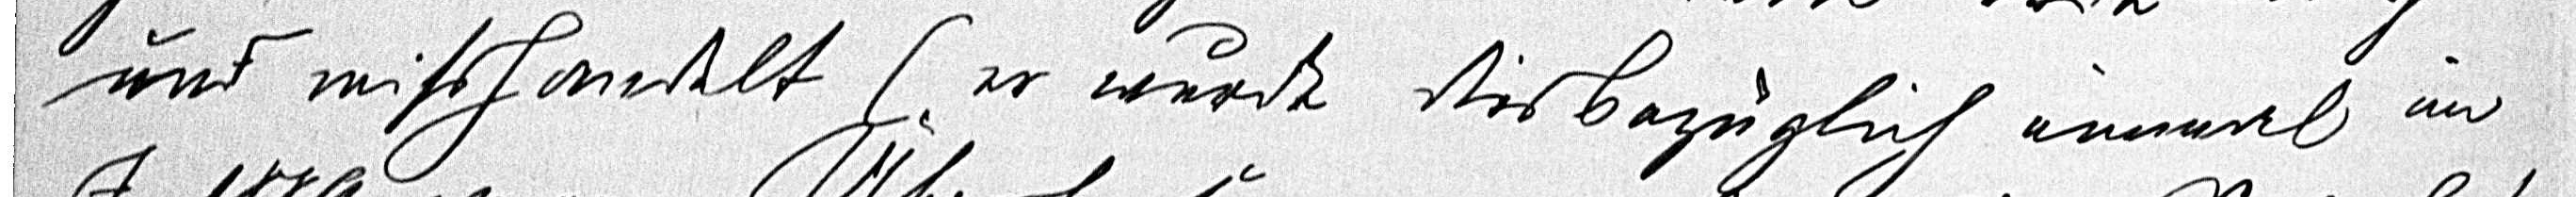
und mißhandelt (er wurde diesbezüglich einmal im
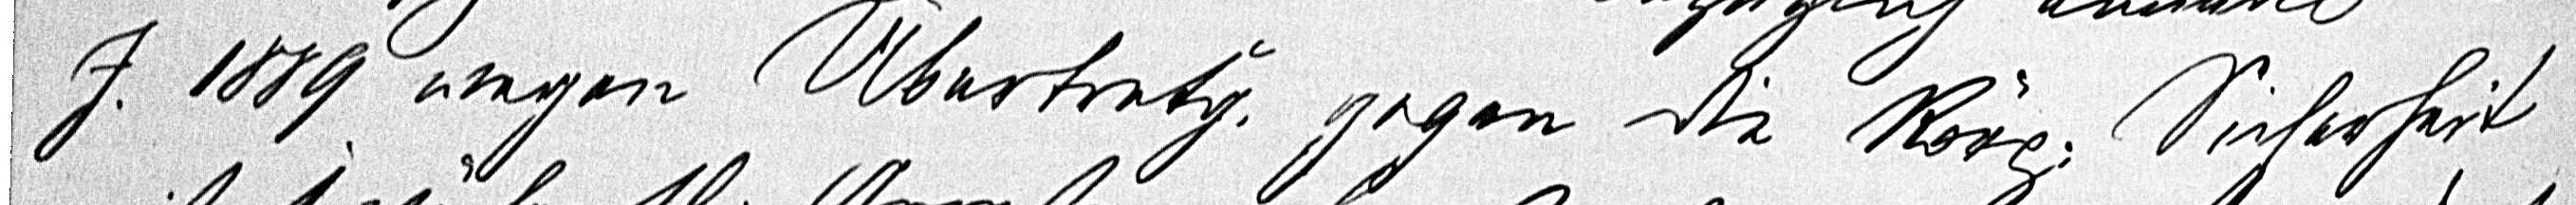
J. 1889 wegen Übertretg gegen die körp. Sicherheit
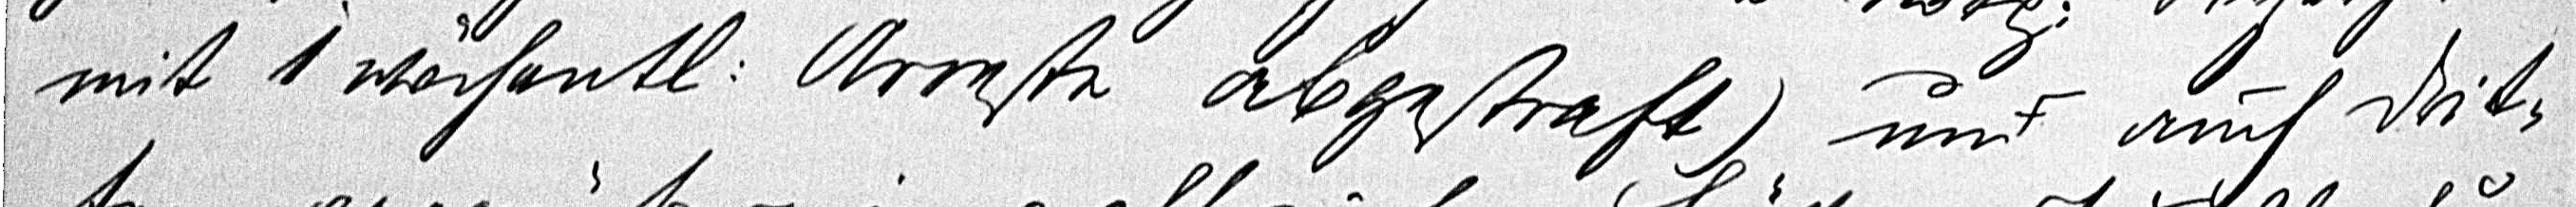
mit 1 wöchentl. Arreste abgestraft) und auch drit¬
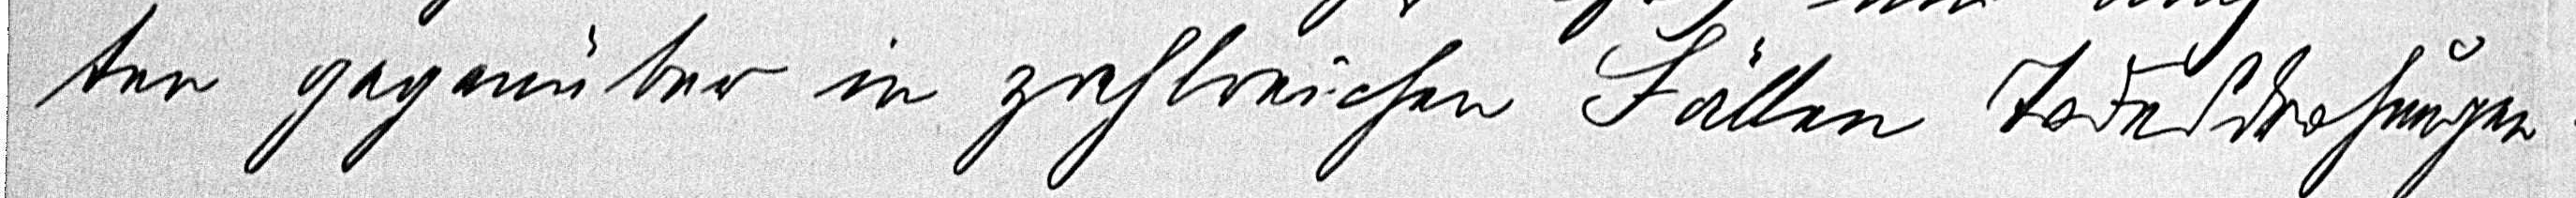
ten gegenüber in zahlreichen Fällen Todesdrohungen
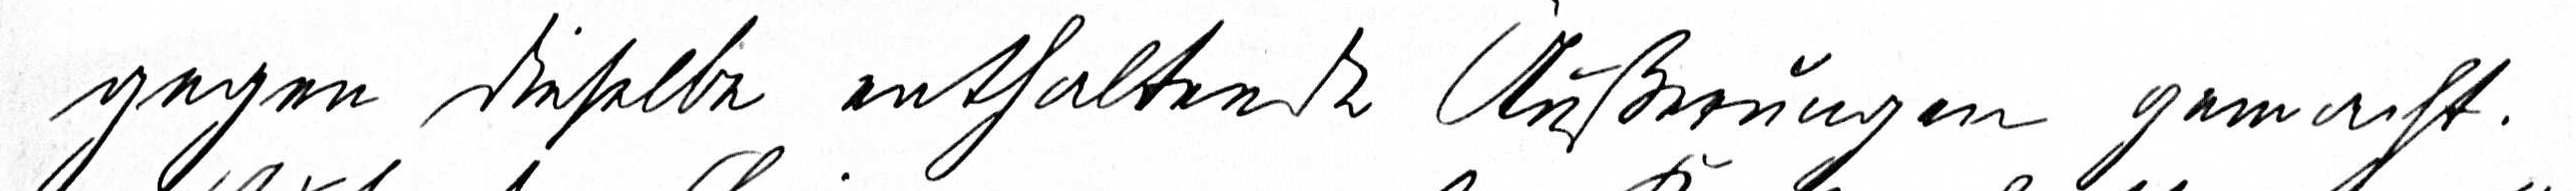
gegen dieselbe enthaltende Äußerungen gemacht.
